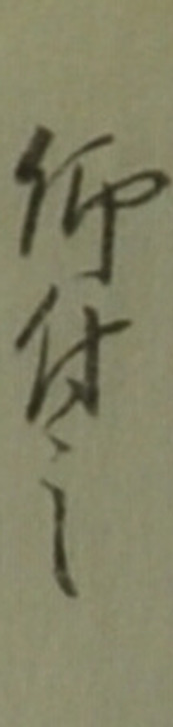仰付之
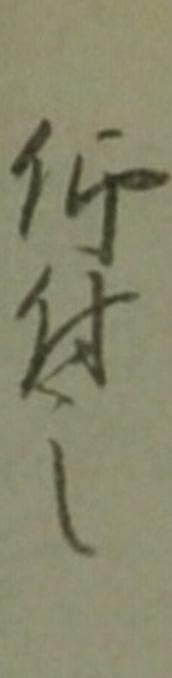仰付之
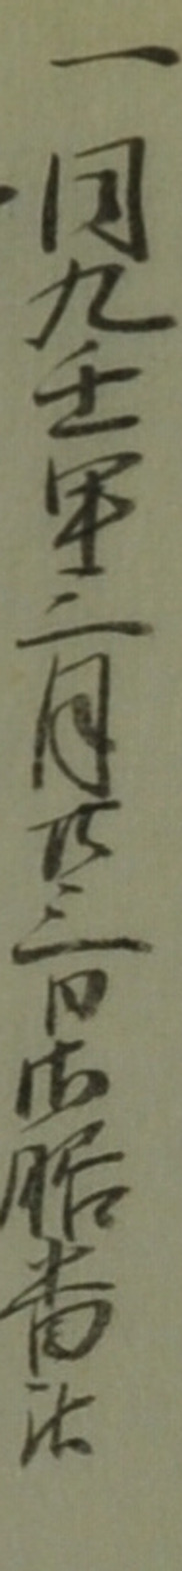一同九壬申三月廿三日御膳番被
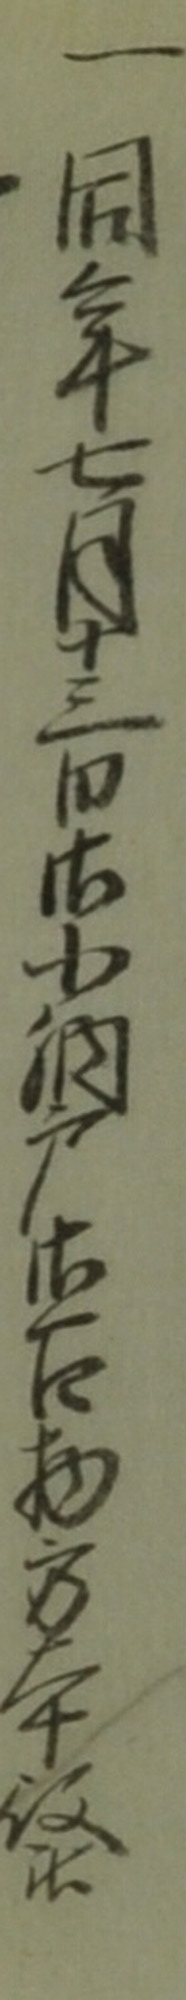一同年七月十三日御小納戸御召物方本役被
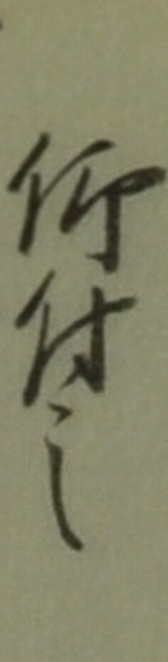仰付之
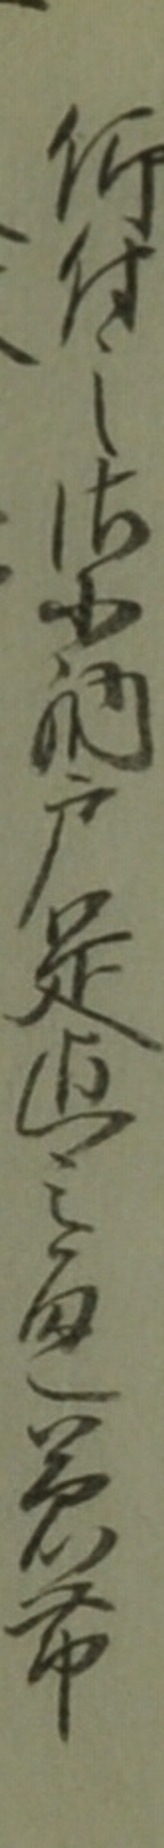仰付之御小納戸是迄之通兼帯
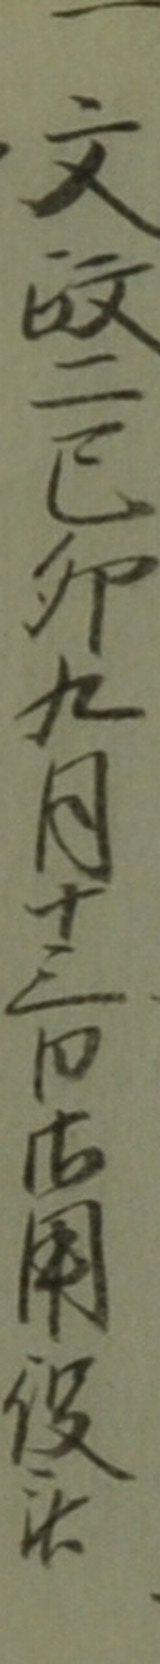一文政二己卯九月十三日御用役被
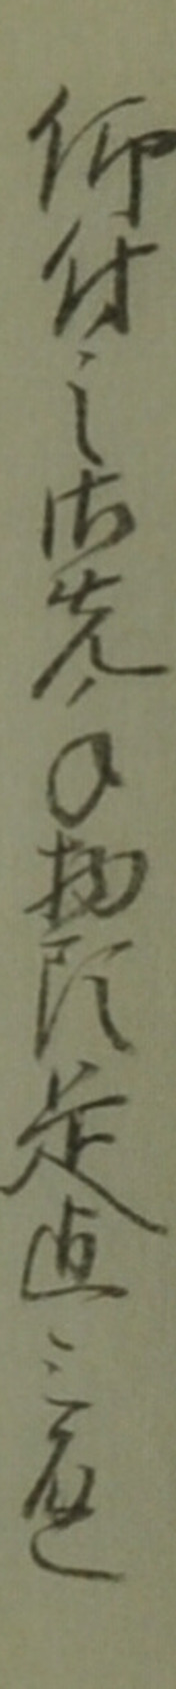仰付之御先手物頭是迄之通
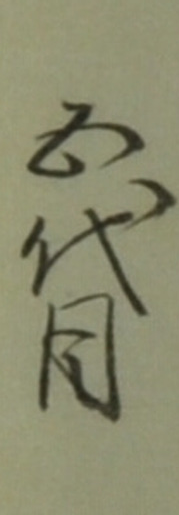五代目

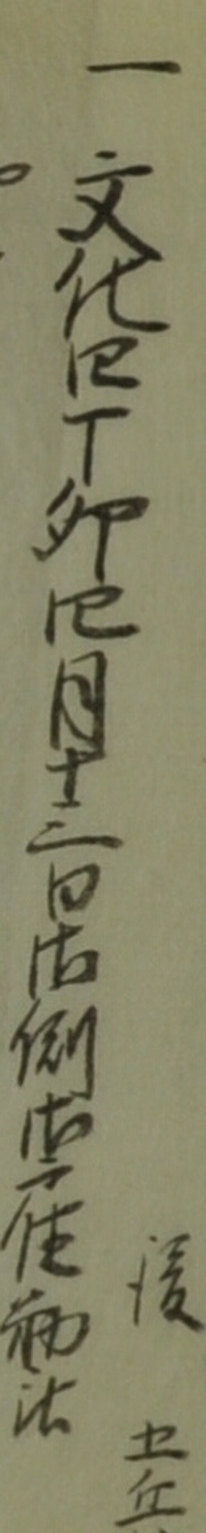一文化四丁卯四月十三日御側御雇勤被
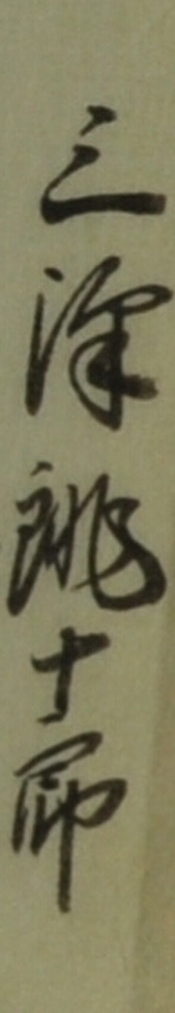三沢緋十郎
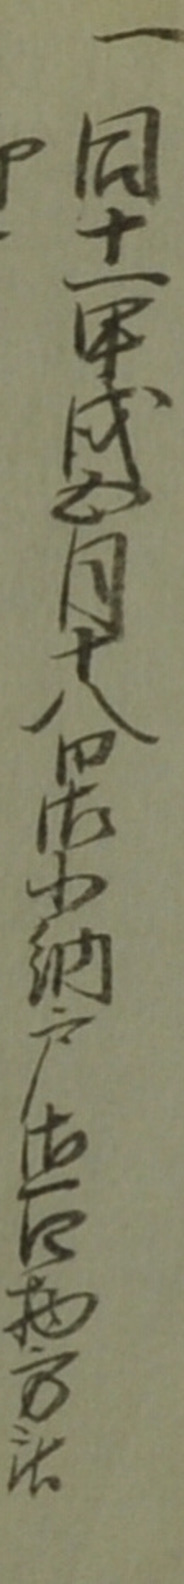一同十一甲戌五月十八日御小納戸御召物方被
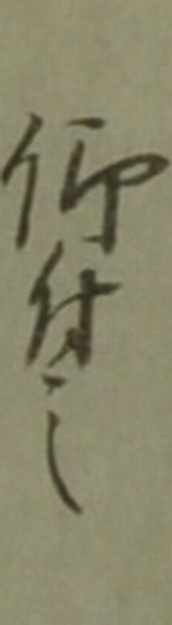仰付之
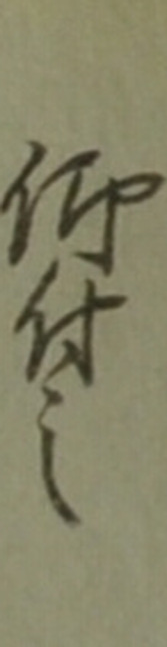仰付之
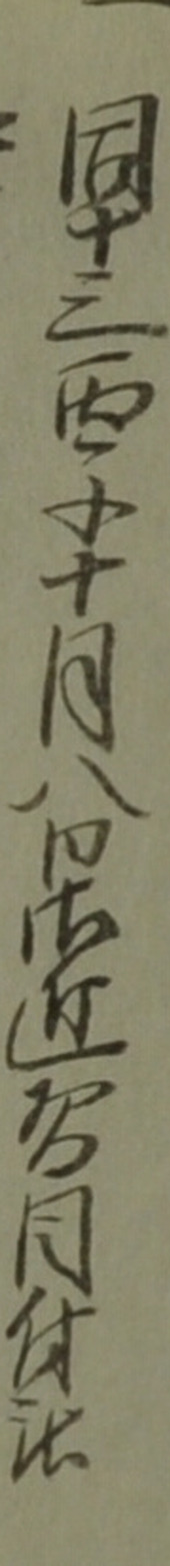一同十三丙子十月八日御近習目付被
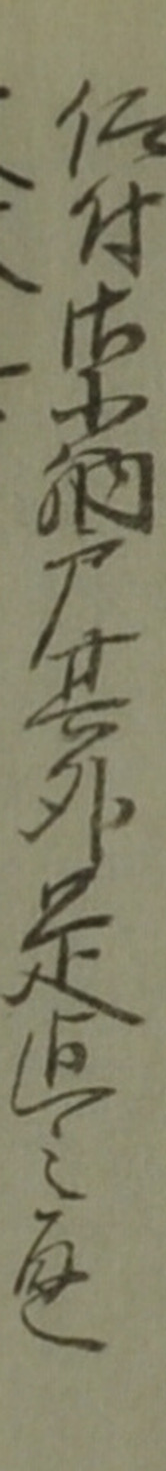仰付御小納戸其外是迄之通
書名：諸御役代々録（五）
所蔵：伊那市立高遠町図書館・合同会社AMANE
